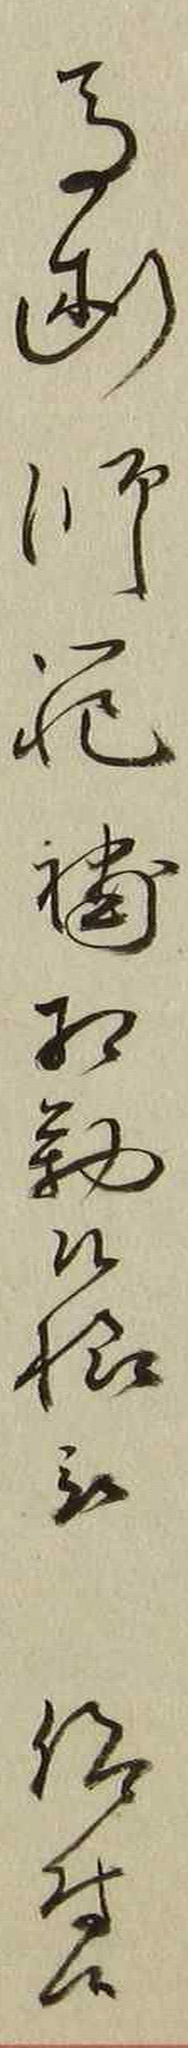馬術師範補相勤候様被仰付候
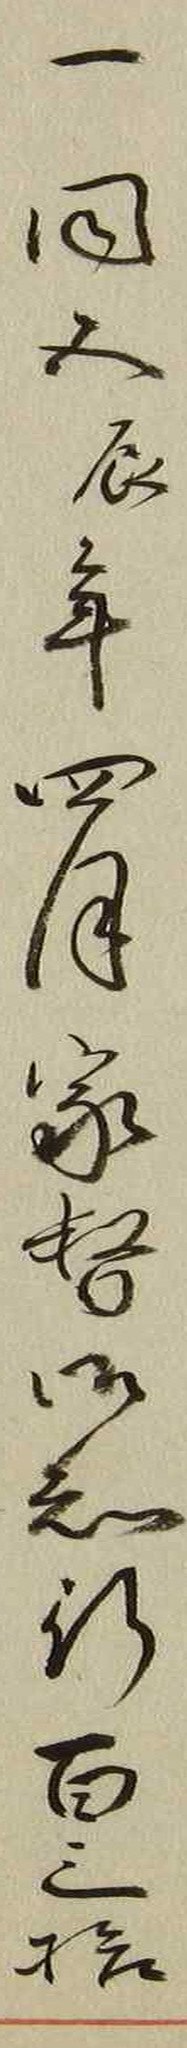一同五辰年四月家督御知行百三拾
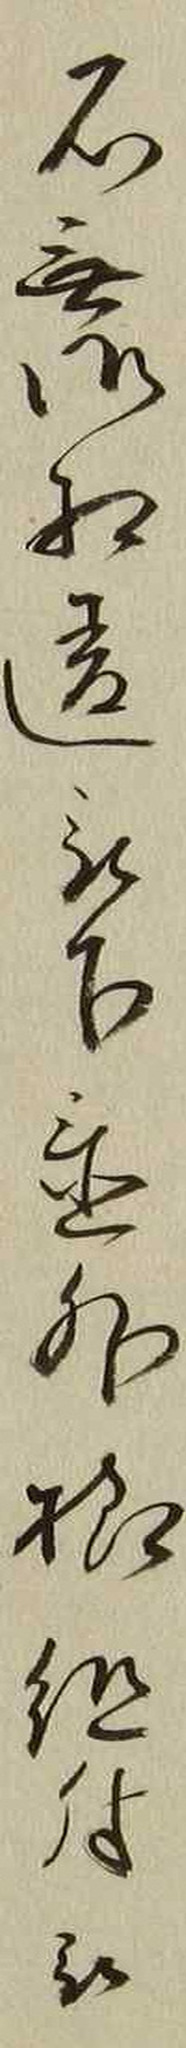石無御相違被下置外様組付被
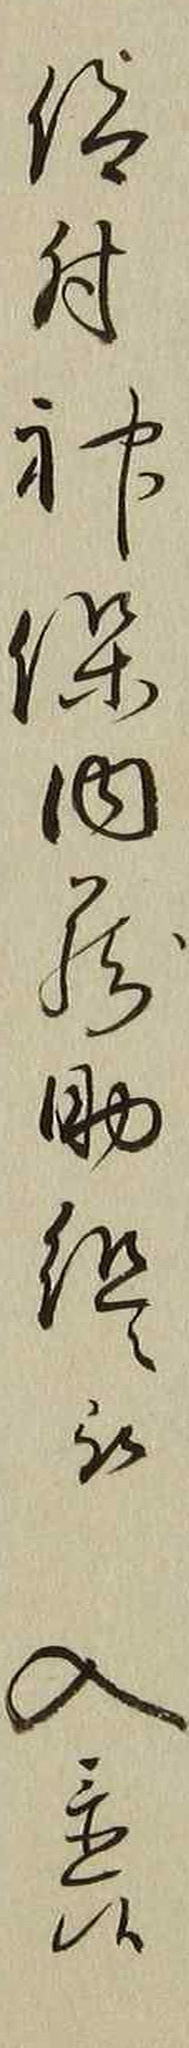仰付神保内蔵助組に被入置候
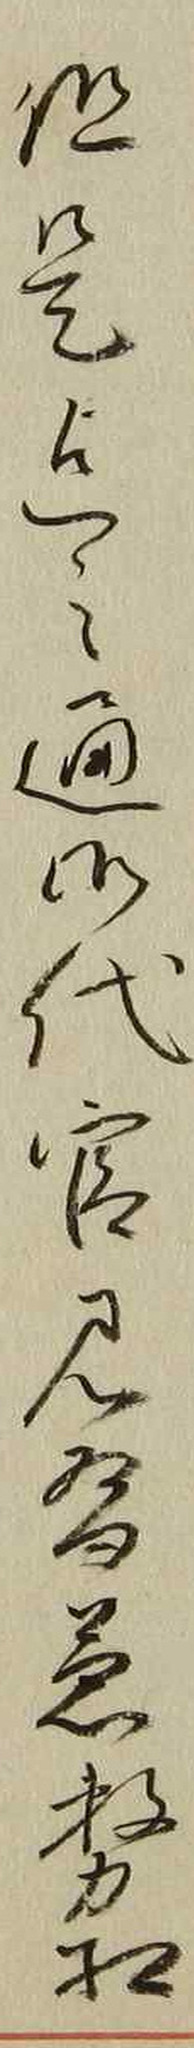但是迄之通御代官見習兼務相
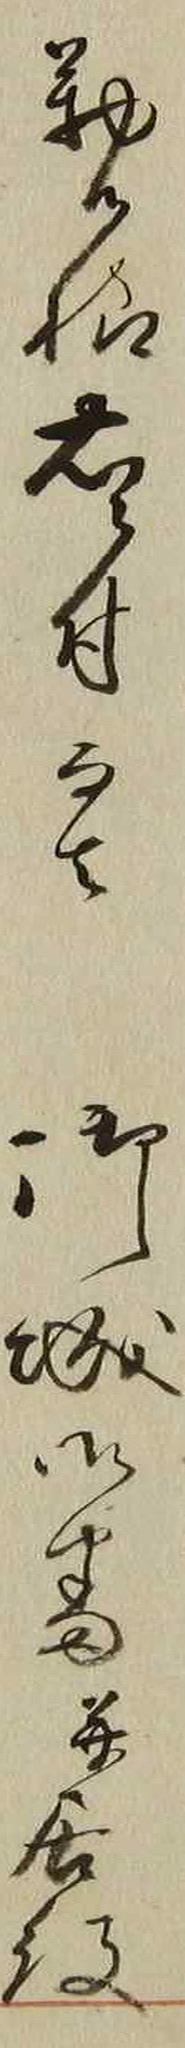勤候様右に付而は御城御番幷居役
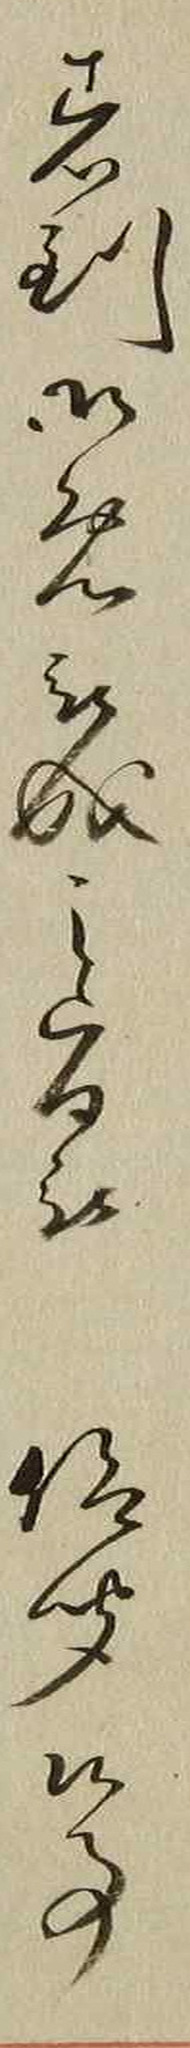着到御免被成之旨被仰聞候事
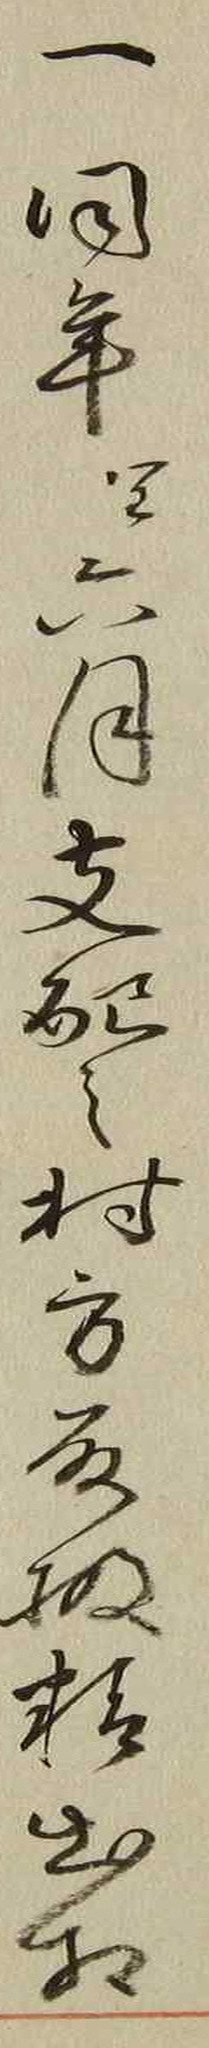一同年閏六月支配之村方取扱精出相
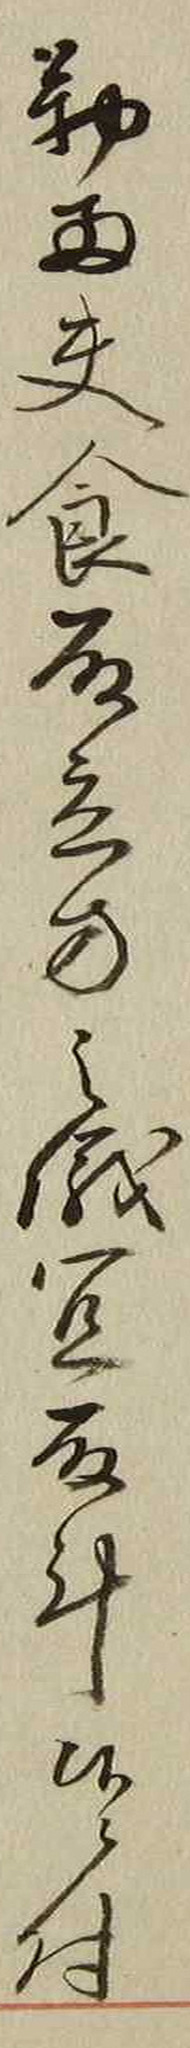勤両夫食取立方之儀宜取計候に付
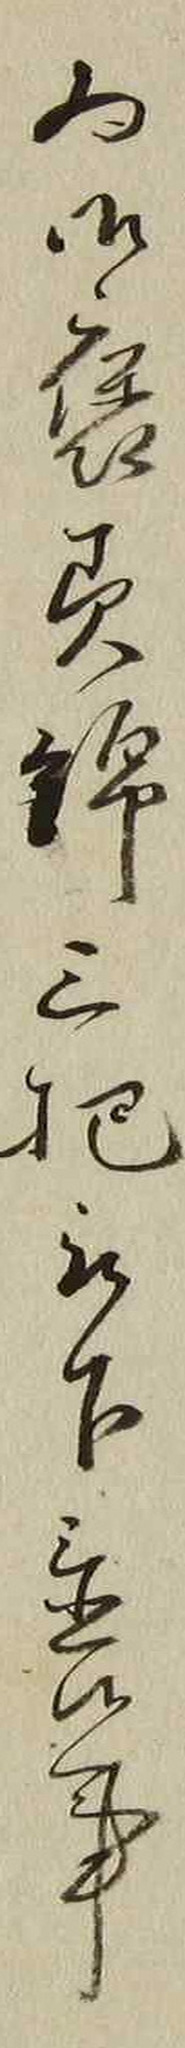為御褒美綿三把被下置候事
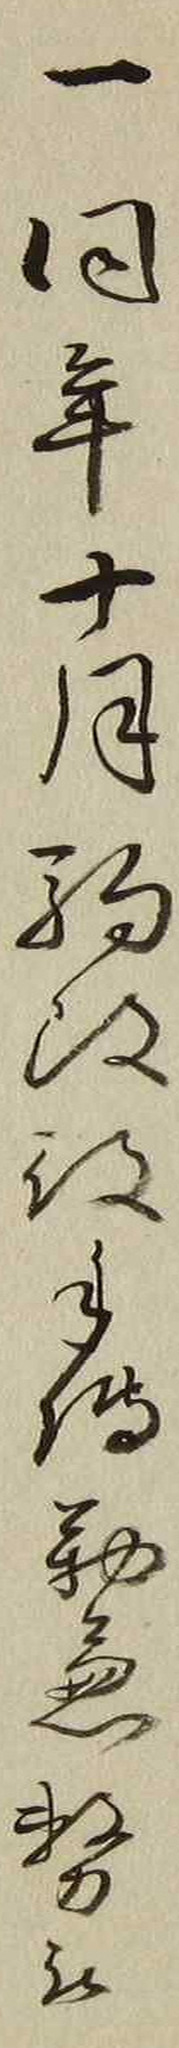一同年十月駒改役手伝兼務被
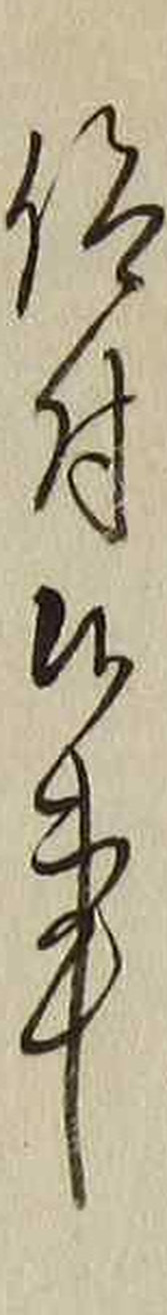仰付候事
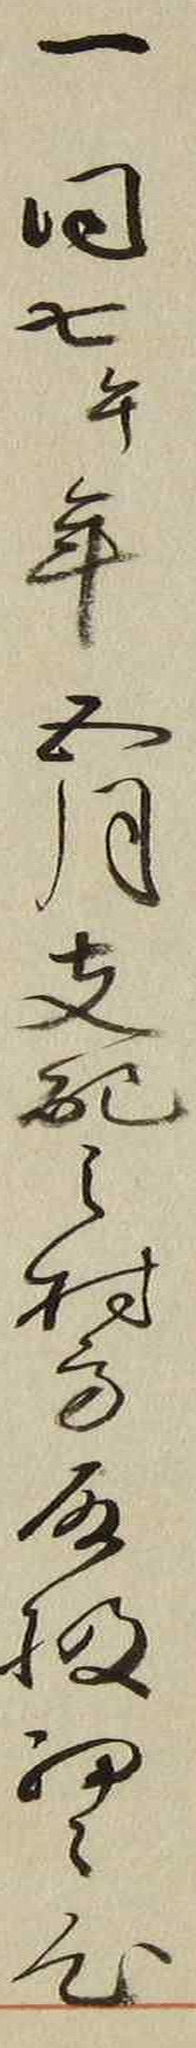一同七丑年五月支配之村方取扱細々心
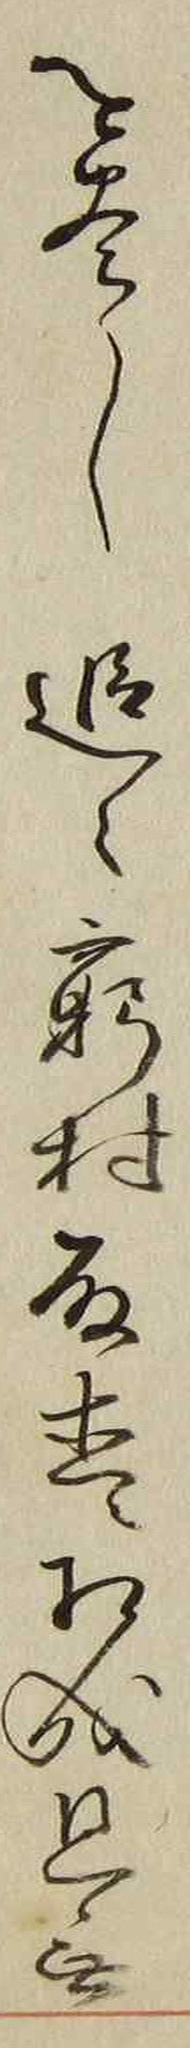を尽し追々窮村取直に相成且無
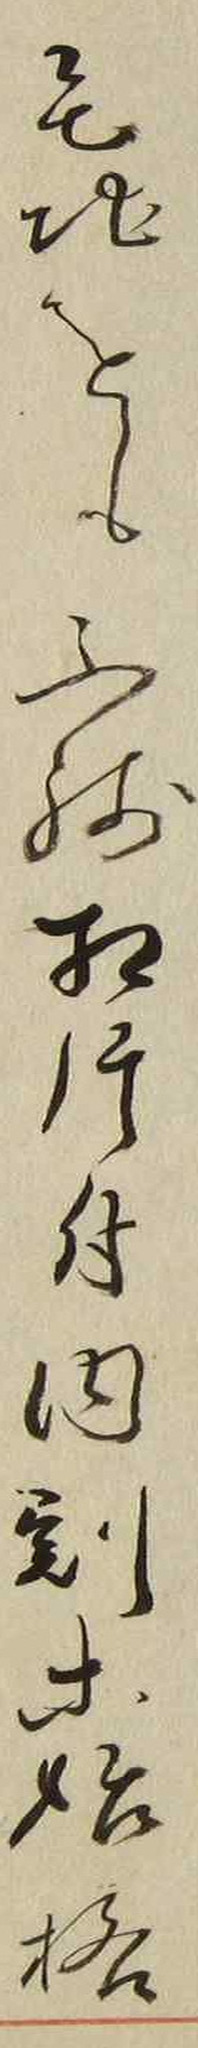毛地をも不残相片付内割等始格

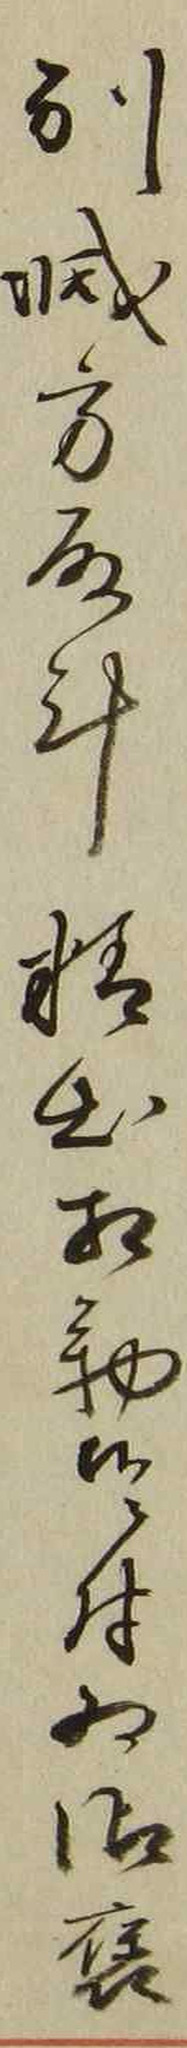別減方取計精出相勤候に付為御褒
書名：諸士系譜　巻之3　い之部3
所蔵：会津若松市立会津図書館
